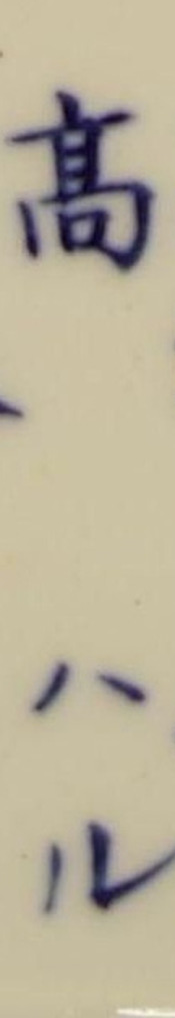高ハル
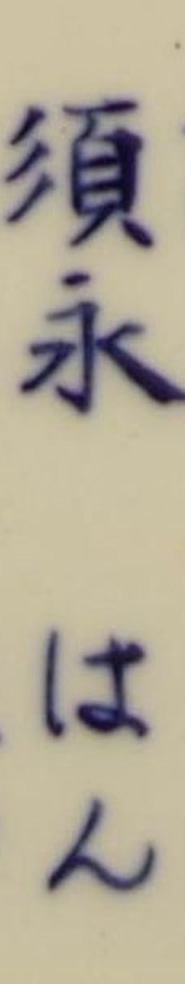須永はん
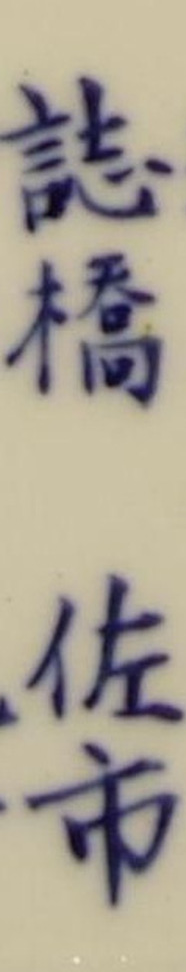誌橋佐市
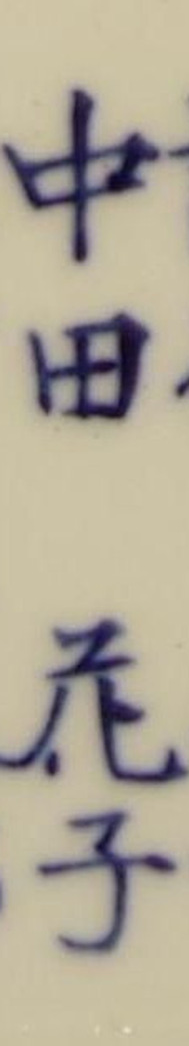中田花子
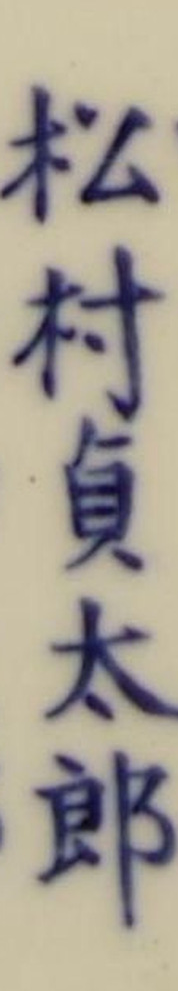松村貞太郎
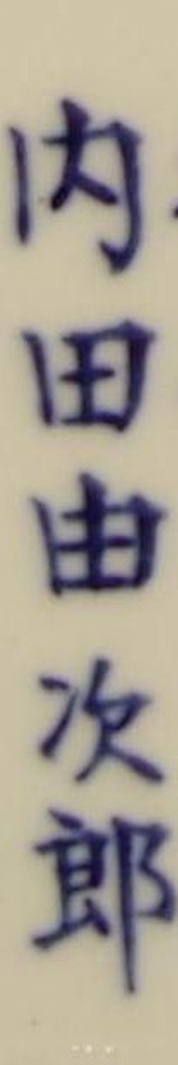内田由次郎
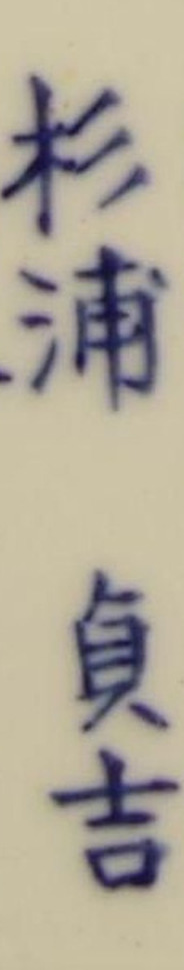松浦貞吉
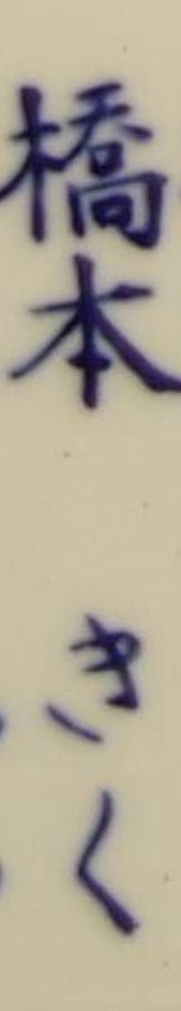橋本きく
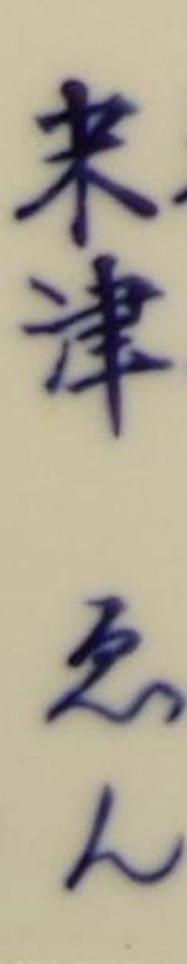米津えん

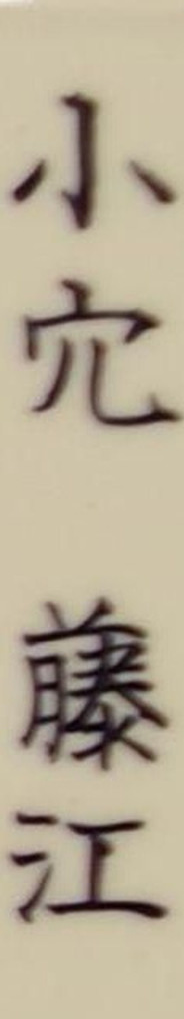小穴藤江
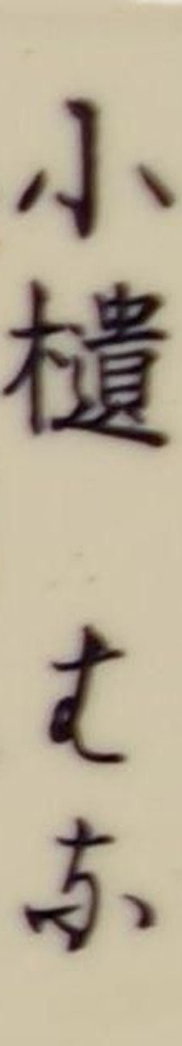小櫃はな
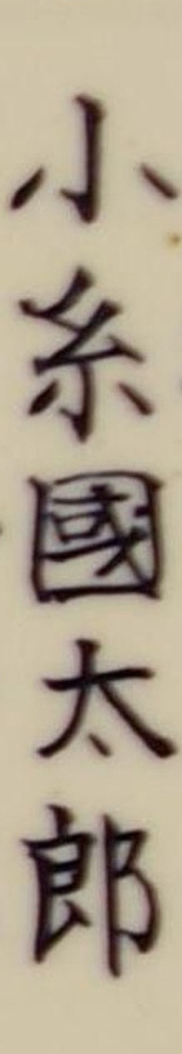小糸國太郎
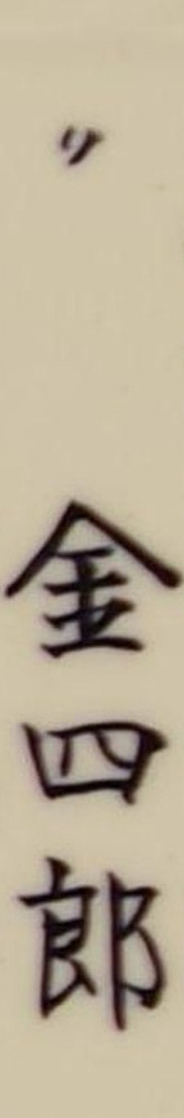金四郎
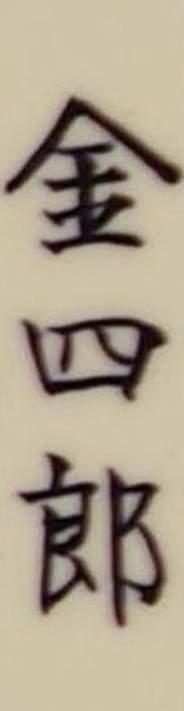金四郎
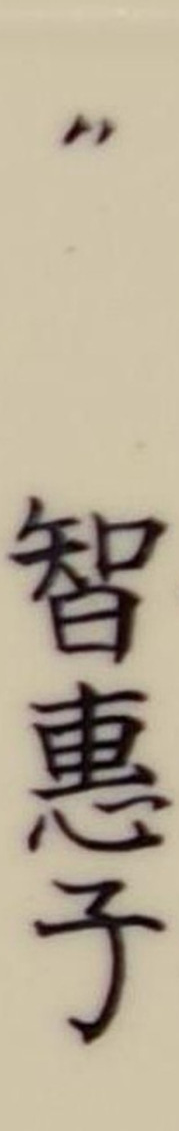智恵子
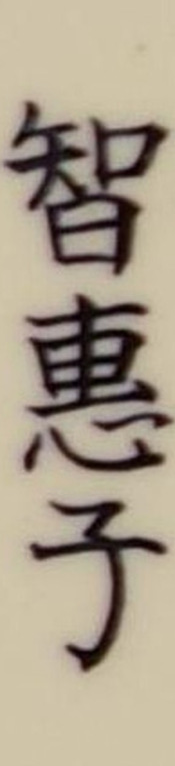智恵子
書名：E~L
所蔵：高野山金剛峯寺
